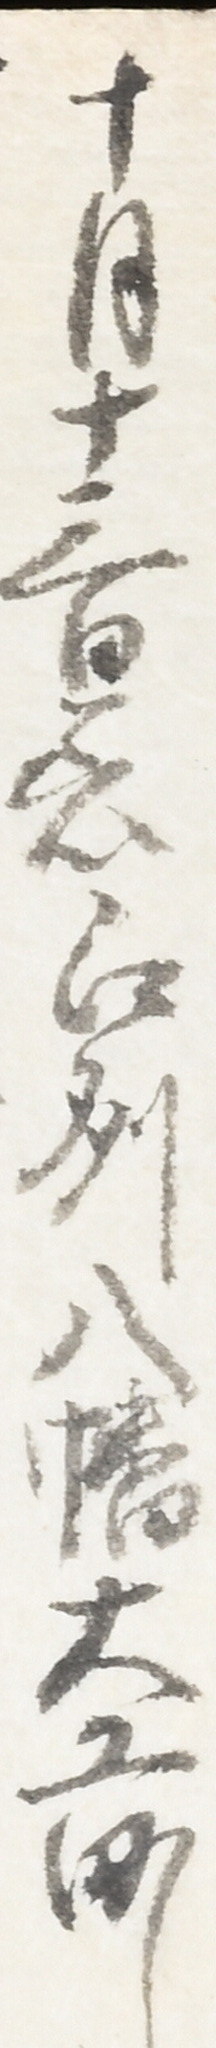十月十三日着江州八幡大工町
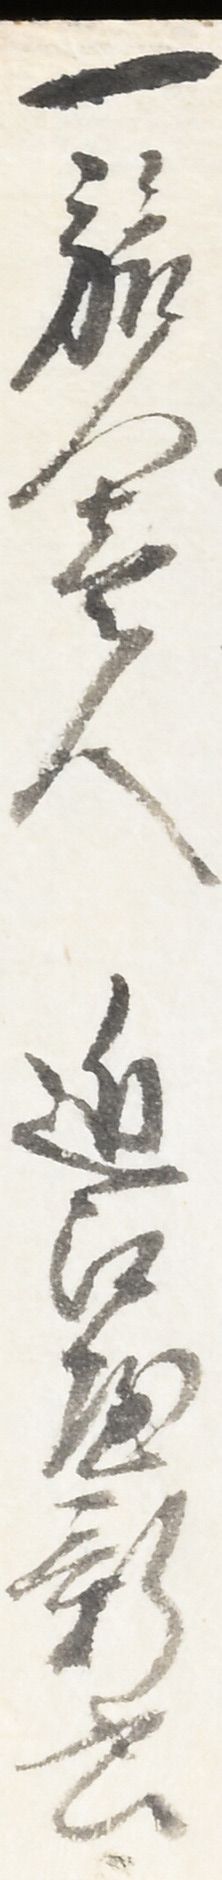一旅人壱人近江屋新六・
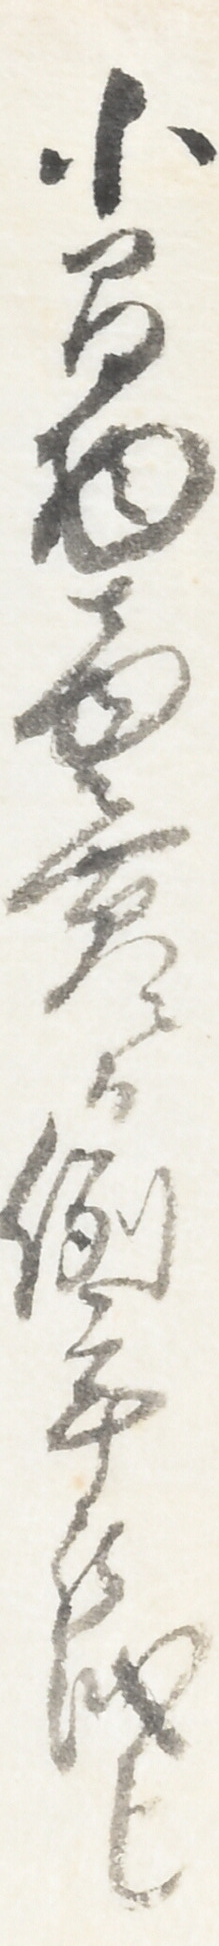小間物商売ニ而例年罷越申候
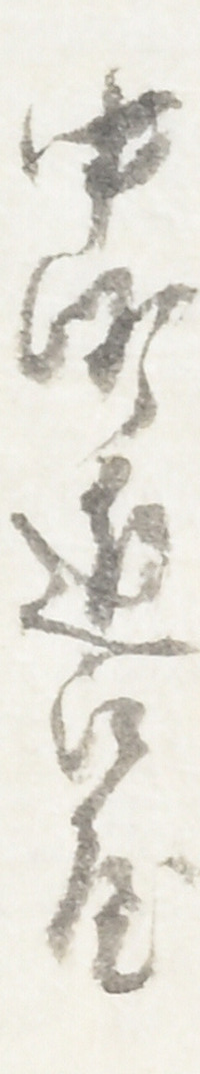中町近江屋
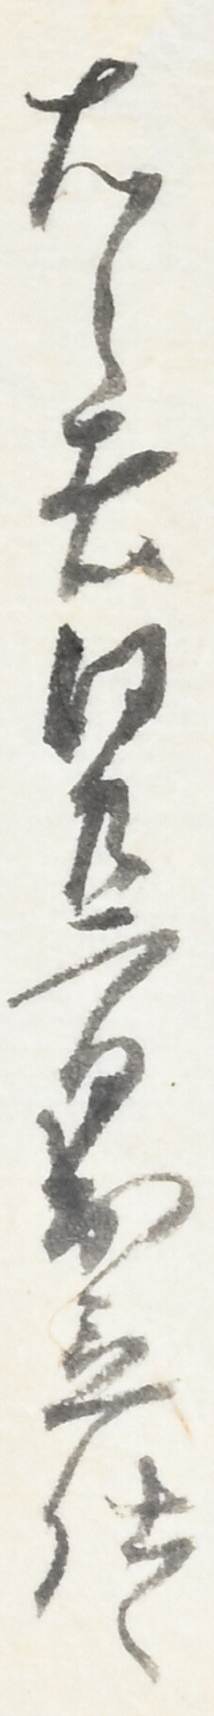右之者同廿二日出立仕候

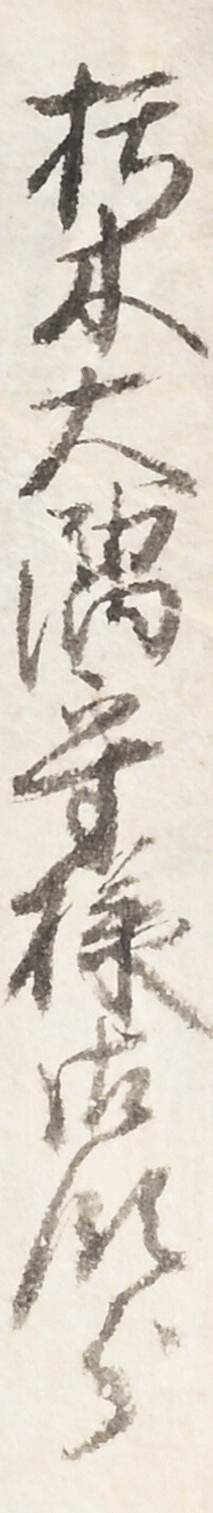朽木大隅守様御領分
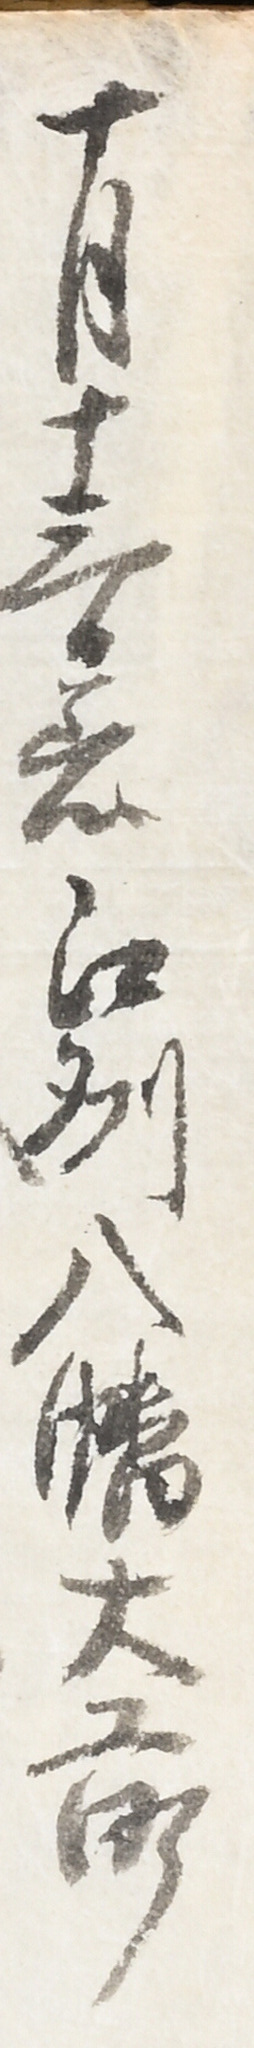十月十三日着江州八幡大工町
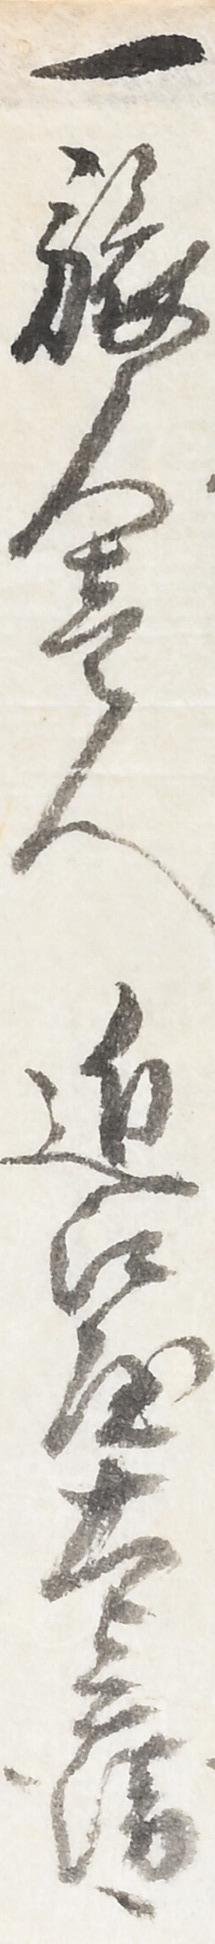一旅人壱人近江屋太兵衛・
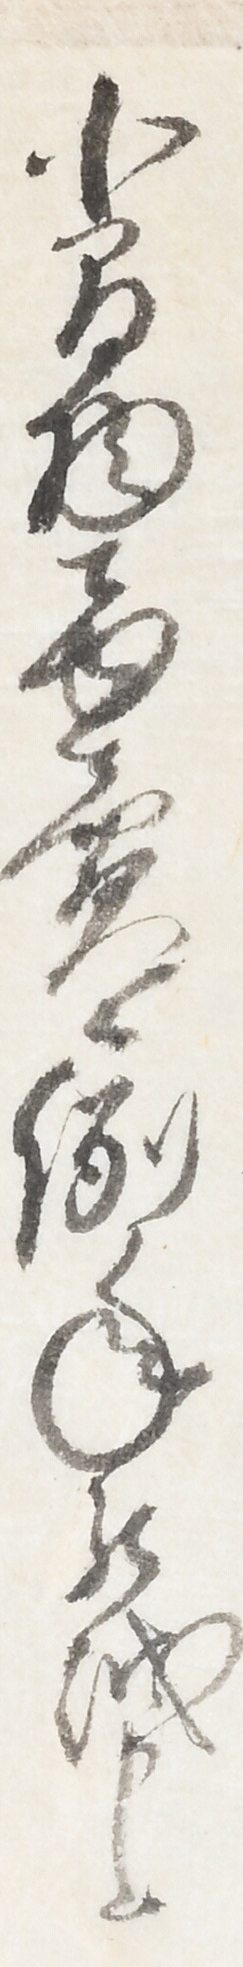小間物商売ニ而例年罷越申候
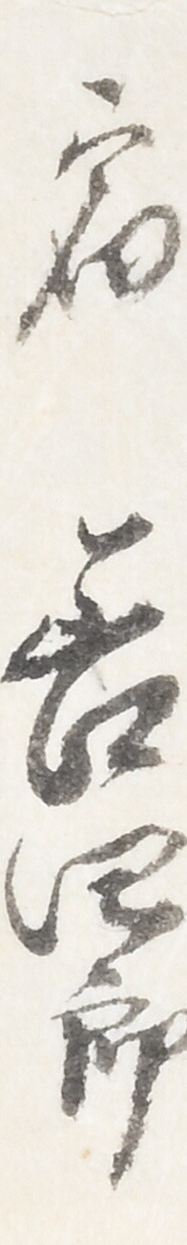宿善四郎
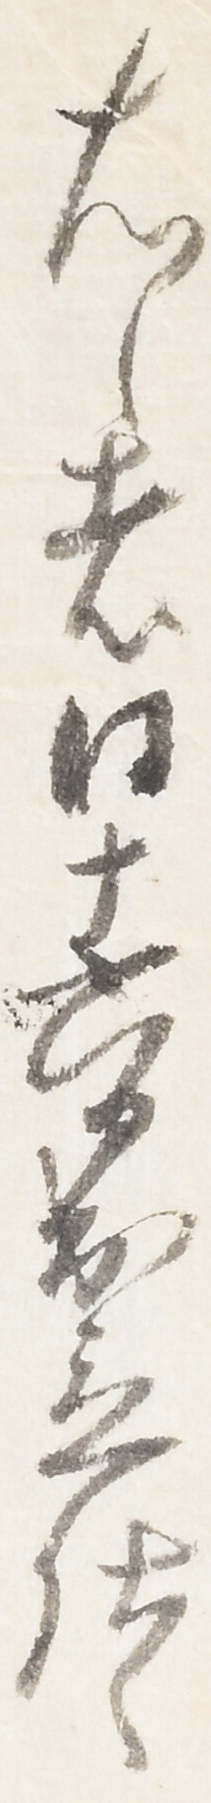右之者同十六日出立仕候
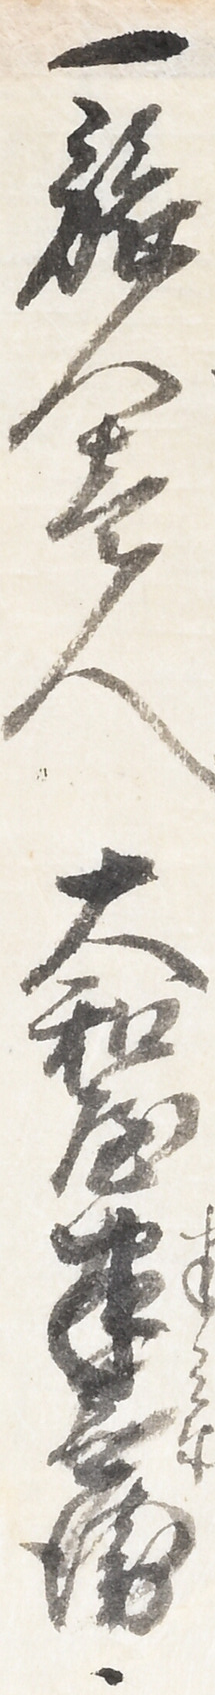一旅人壱人近江屋太兵衛・
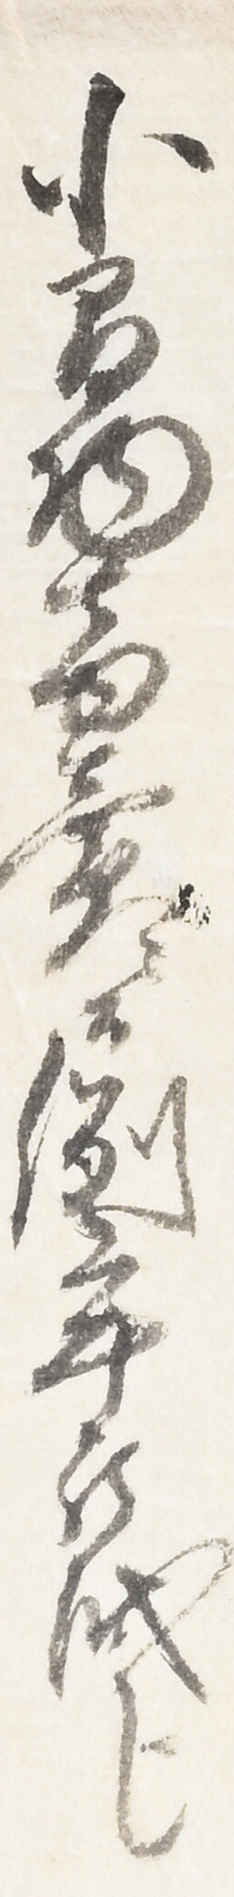小間物商売ニ而例年罷越申候
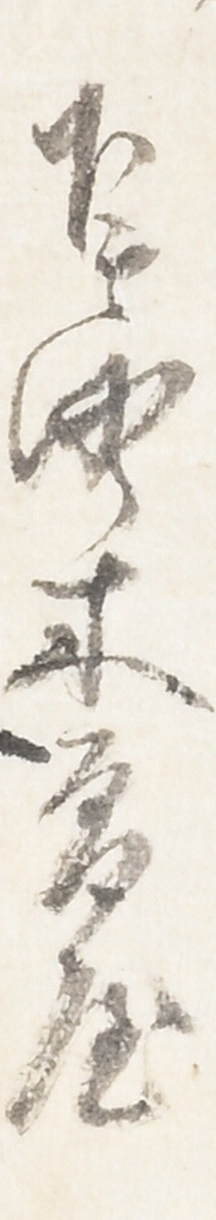下モ町木曽屋
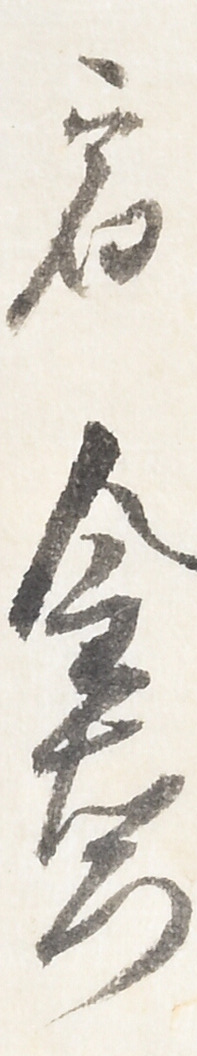宿金右衛門
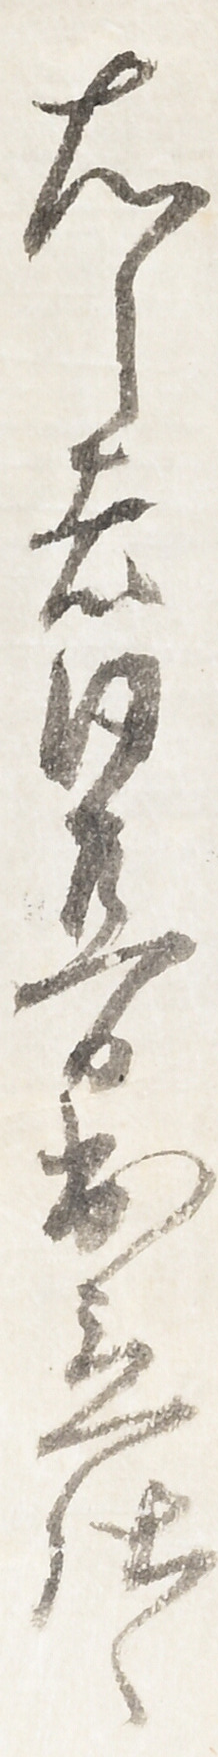右之者同廿一日出立仕候
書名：旅人泊控帳
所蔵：伊那市立高遠町図書館・合同会社AMANE
